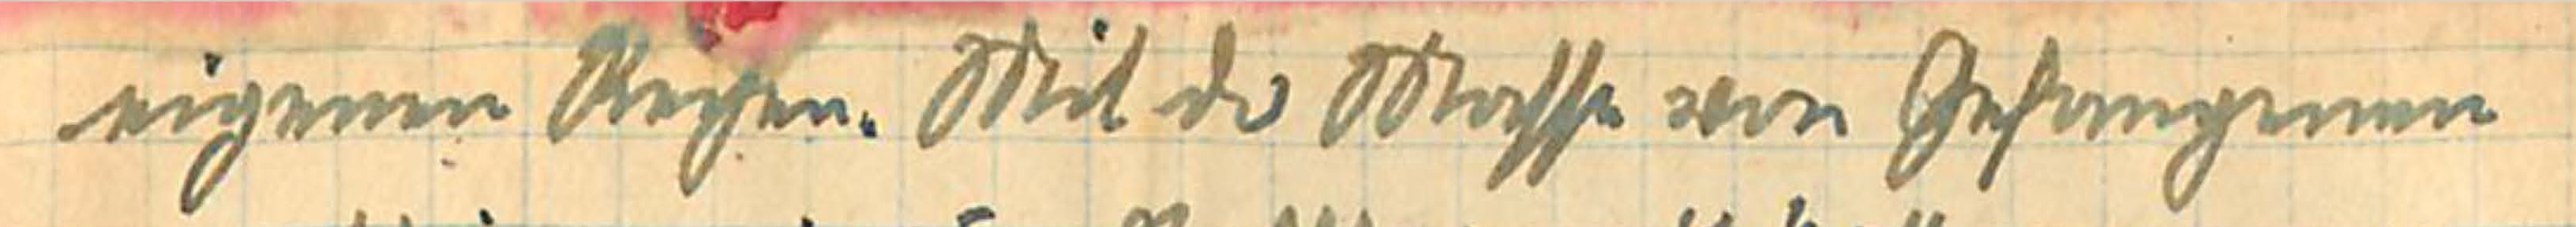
eigenen Reihen. Mit der Masse von Gefangenen
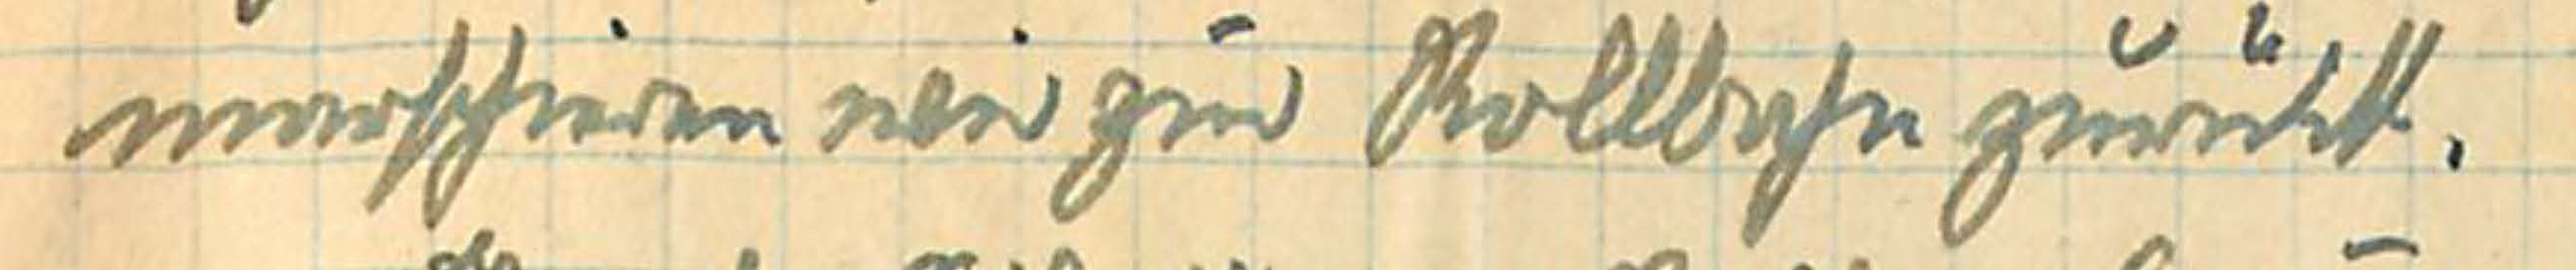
marschieren wir zur Rollbahn zurück.
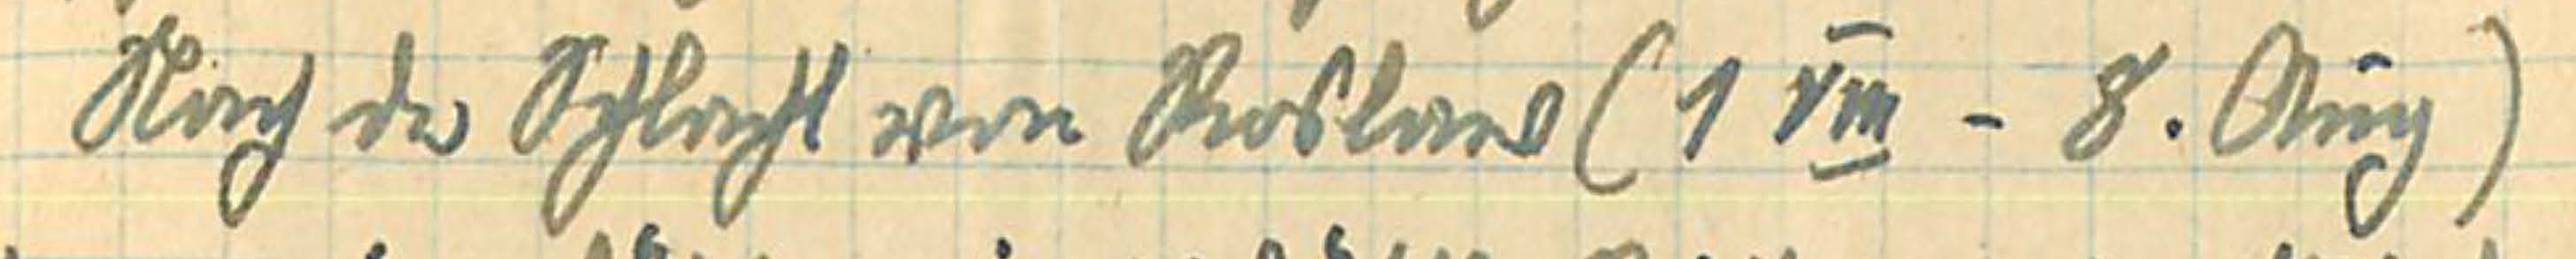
Nach der Schlacht von Rostow (1 VIII - 8. Aug.)
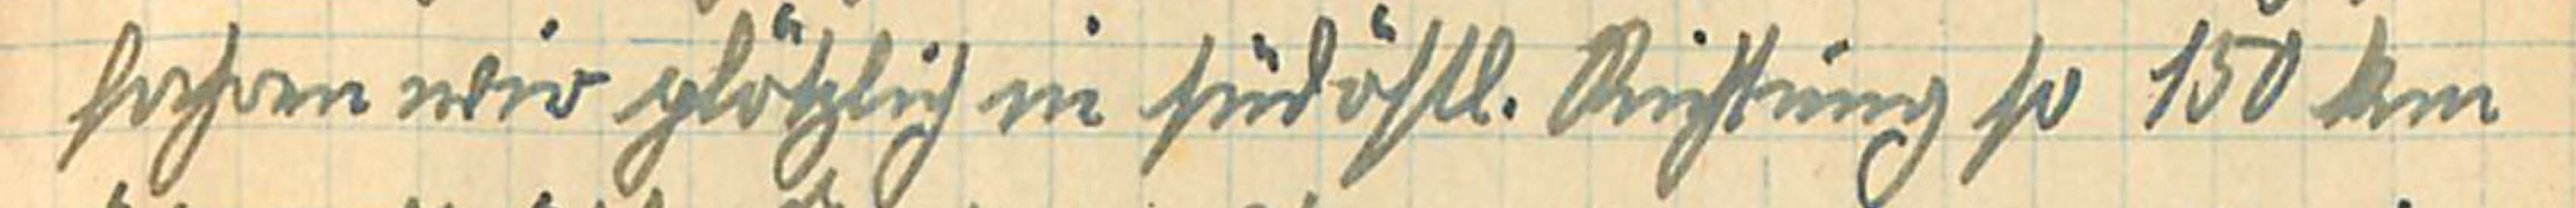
fahren wir plötzlich in südöstl. Richtung so 150 km
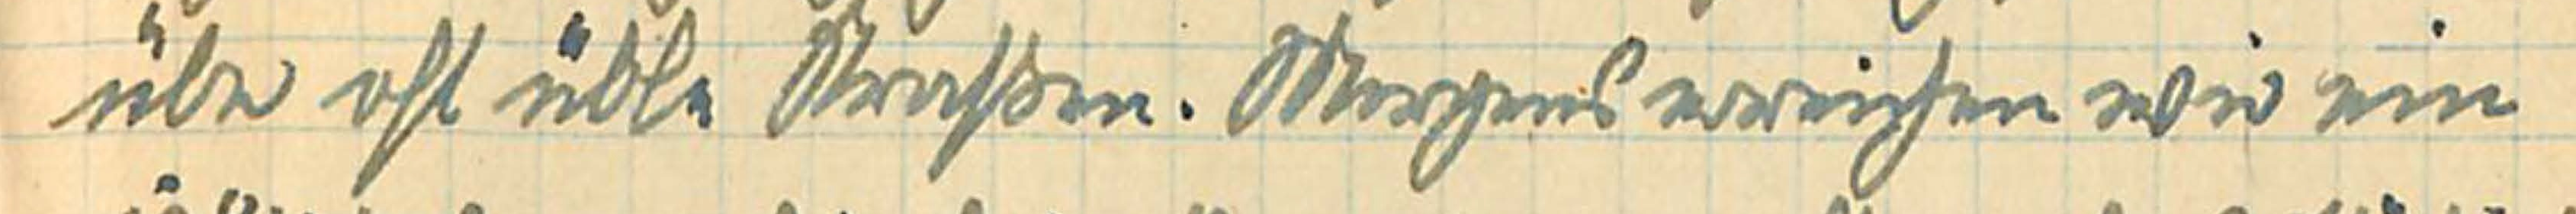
über oft üble Straßen. Morgens erreichen wir ein
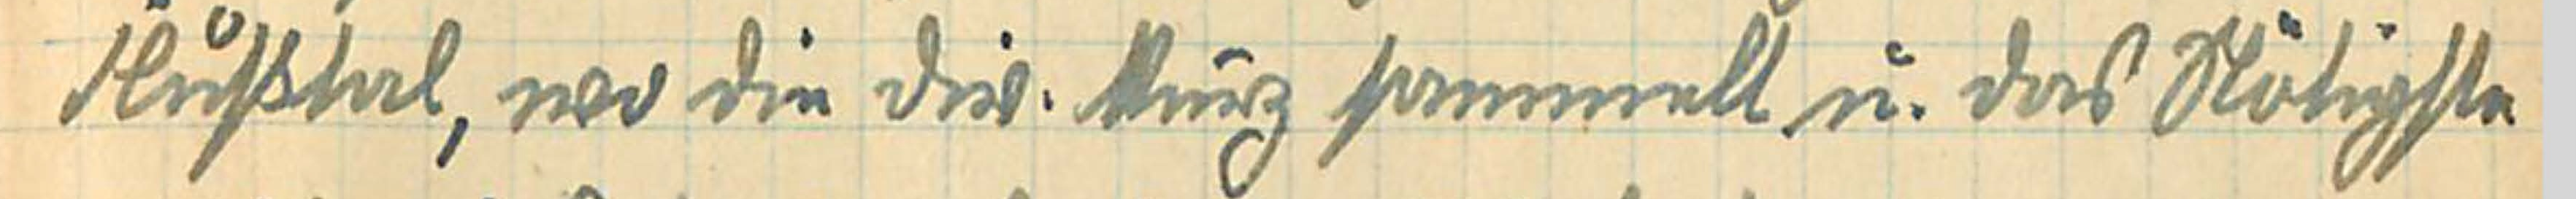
Flußtal, wo die Div. kurz sammelt u. das Nötigste
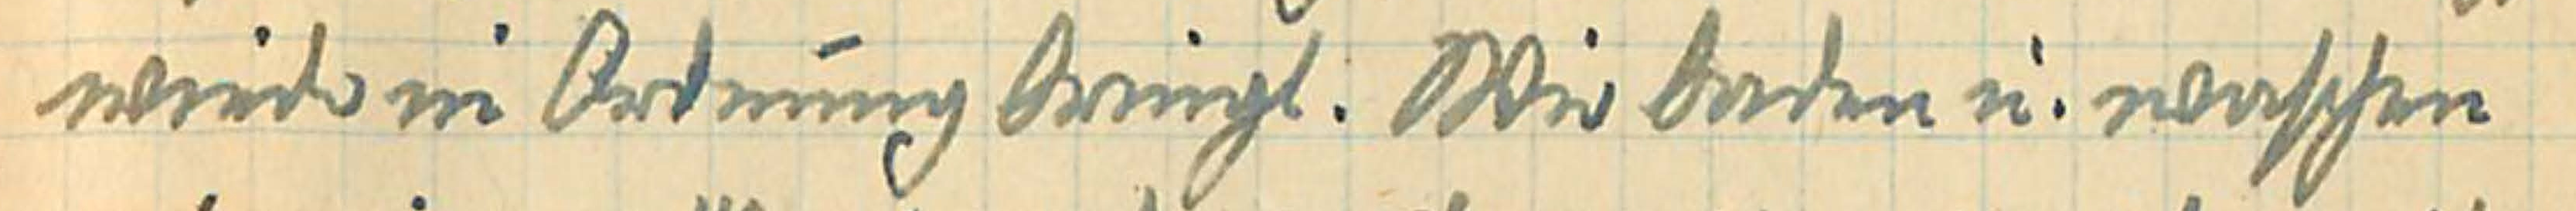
wieder in Ordnung bringt. Wir baden u. waschen
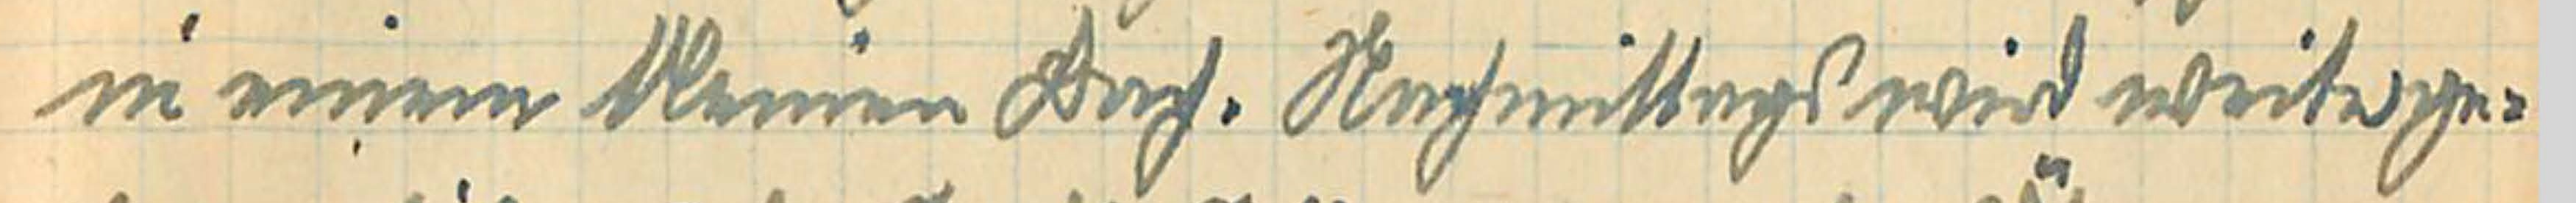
in einem kleinen Bach. Nachmittags wird weiterge-
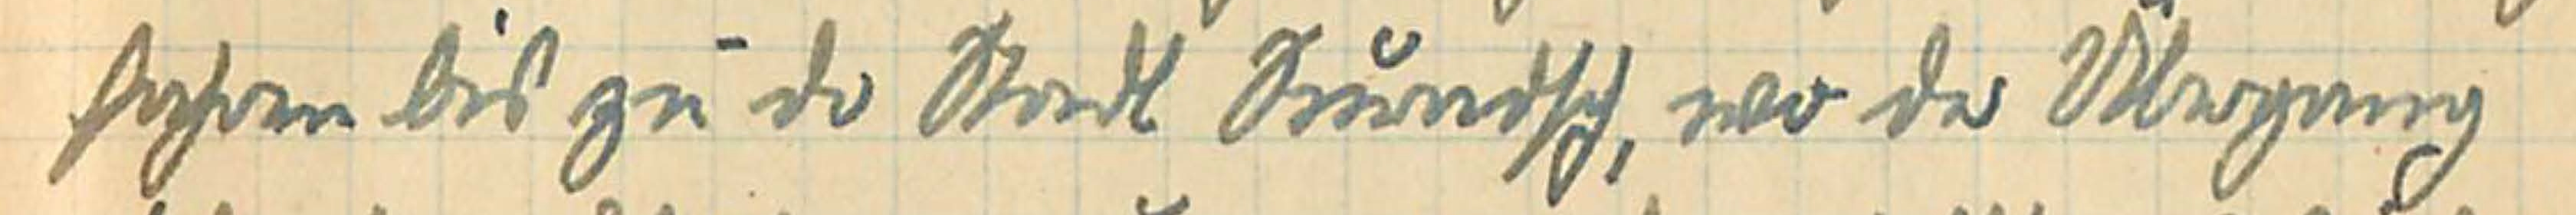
fahren bis zu der Stadt Srundsch, wo der Übergang
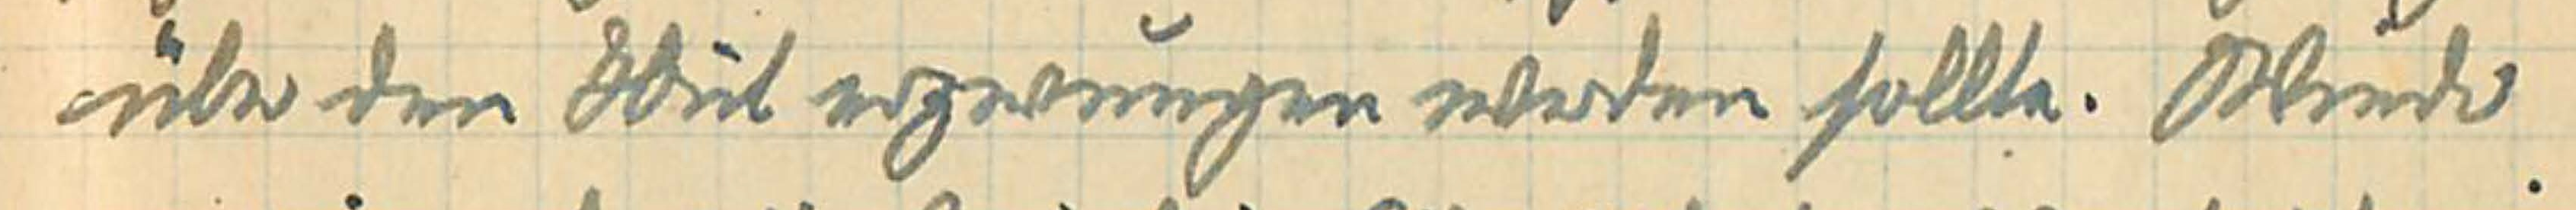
über den Ibut erzwungen werden sollte. Wieder
